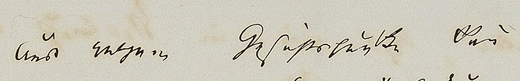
Aus welchem Gesichtspunkte kann
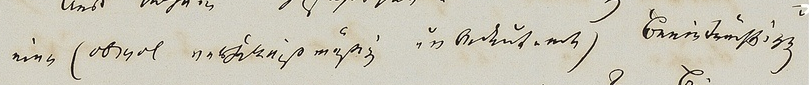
eine (obwol verhältnißmäßig unbedeutende) Beeinträchtigung
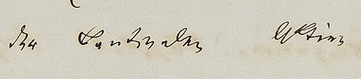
der kantonalen Aktien
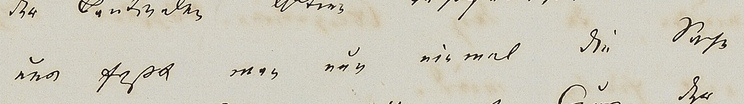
uns faßt man nun einmal die Sache
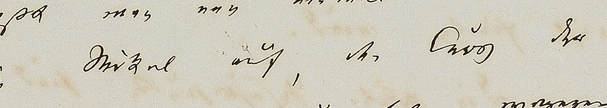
Mittel auf, den Curs der
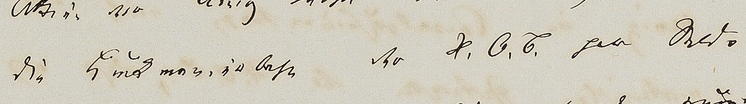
die Luckmanierbahn der N.O.B. per Saldo
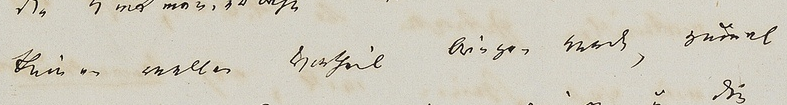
keinen reellen Vortheil bringen wird, zumal
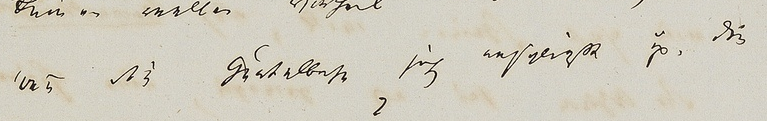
wenn die Gürtelbahn sich anschließt &. die
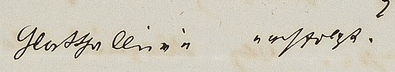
Glatthallinie nachfolgt?
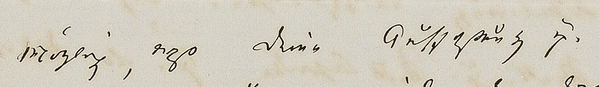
Möglich, dass Deine Auffaßung &.
